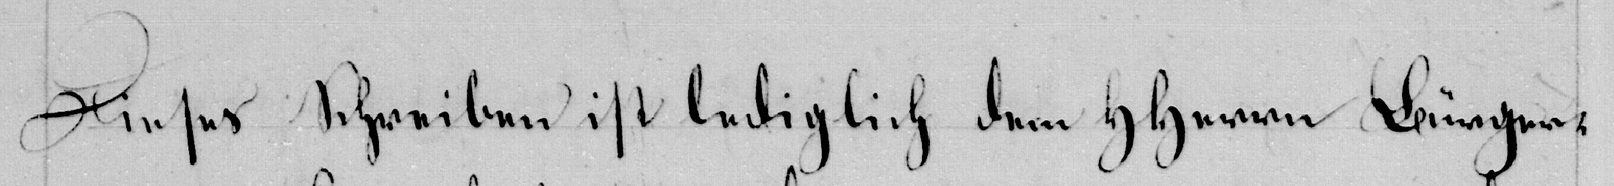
Dieses Schreiben ist lediglich dem HHerrn Bürger¬
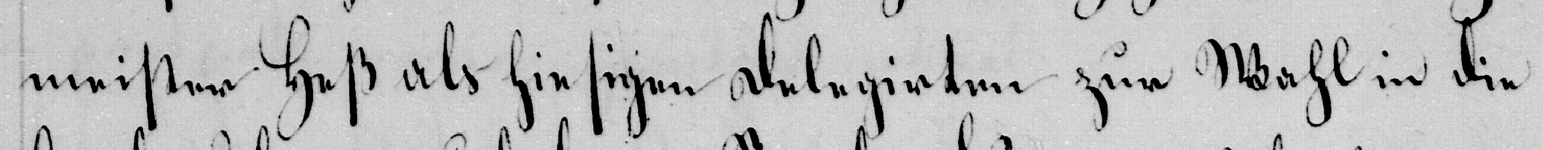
meister Heß als hiesigen Delegirten zur Wahl in die
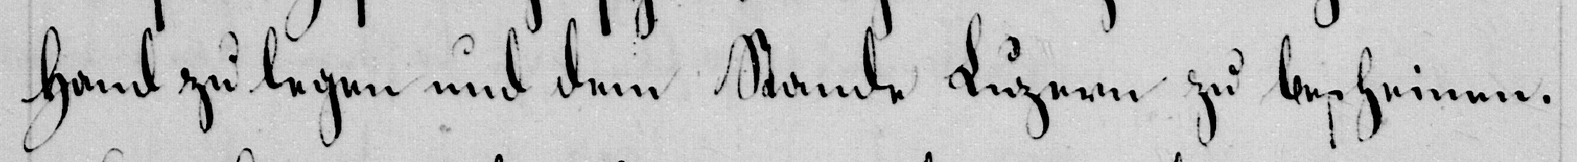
Hand zu legen und dem Stande Luzern zu becheinen.
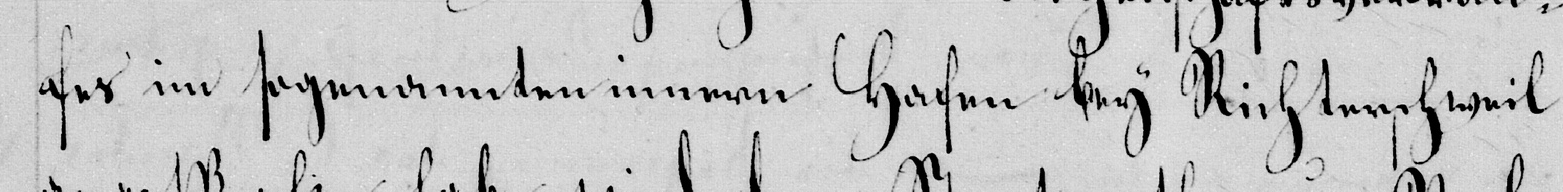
fes im sogenannten innern Hafen bey Richterschweil
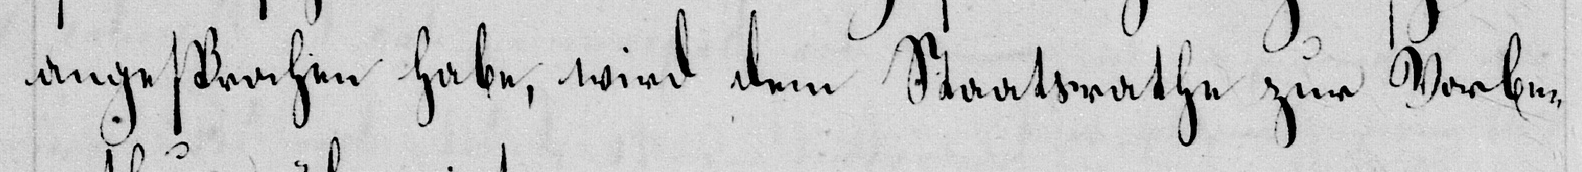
angesprochen habe, wird dem Staatsrathe zur Vorbe¬
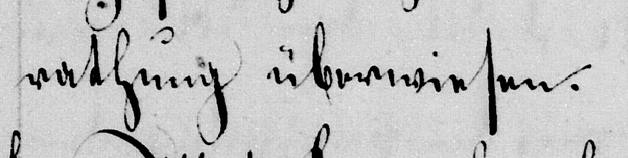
rathung überwiesen.
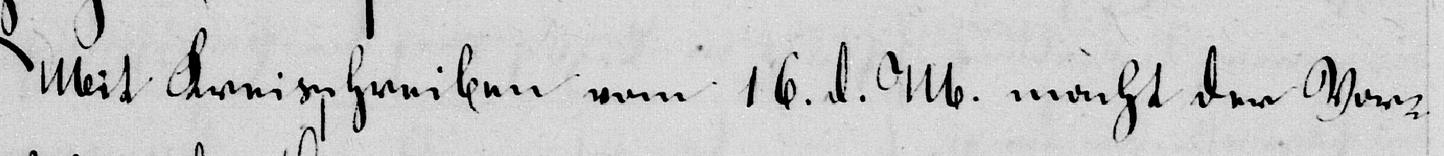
Mit Kreisschreiben vom 16. d. M. macht der Vor¬
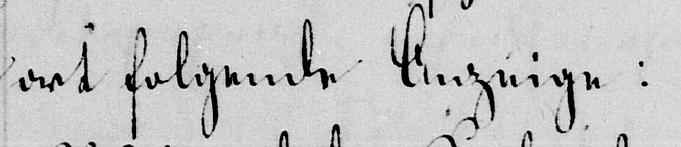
ort folgende Anzeige:
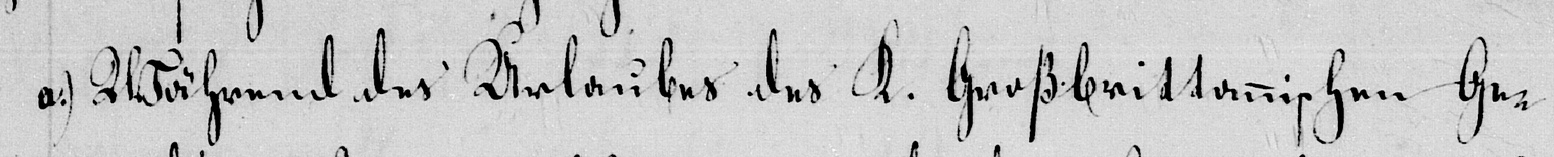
a.) Während des Urlaubes des K. Großbritannischen Ge¬
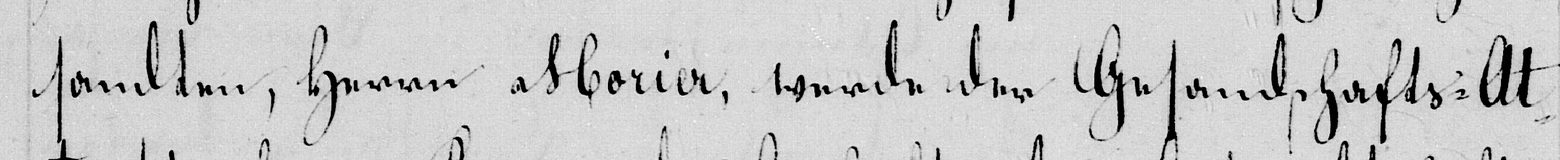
sandten, Herrn Morier, werde der Gesandtschafts-At¬
